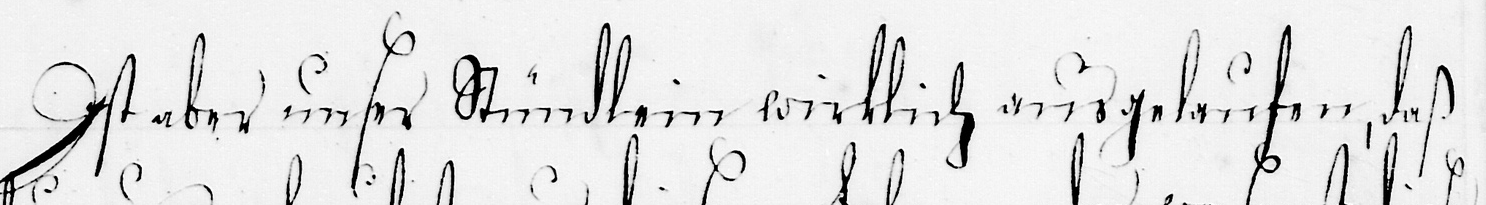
Ist aber unser Stündlein wirklich ausgelaufen, daß
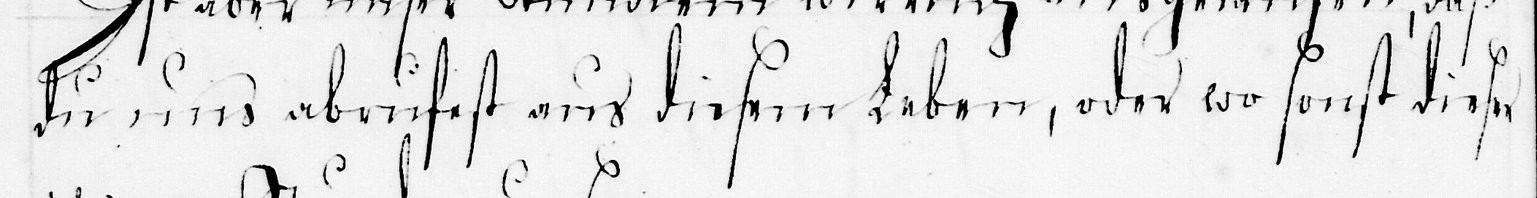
du uns abrufest aus diesem Leben, oder wo sonst dies¬
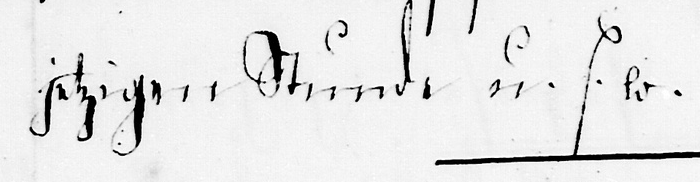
jetzigen Stunde u. s. w.
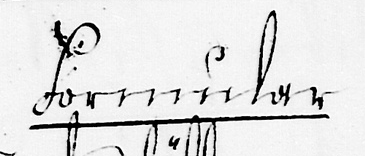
Formular
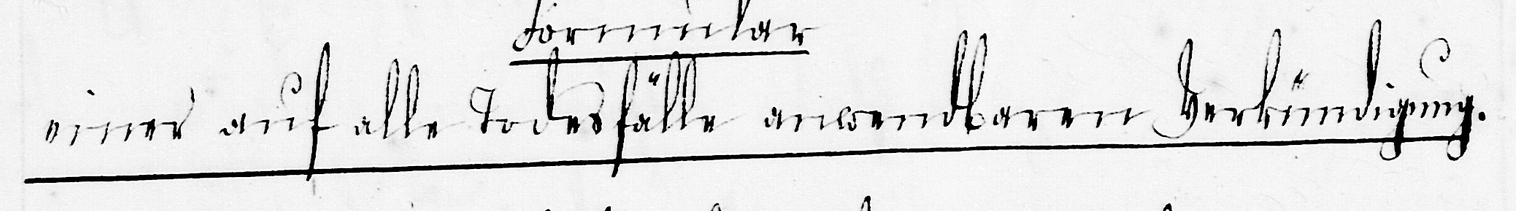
einer auf alle Todesfälle anwendbaren Verkündigung.
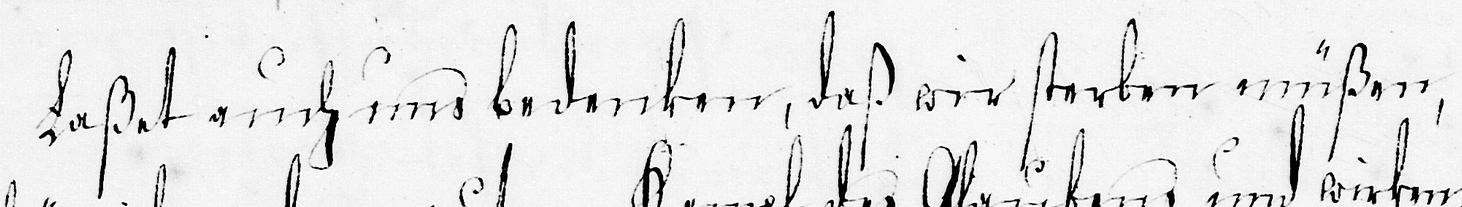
Laßet auch uns bedenken, daß wir sterben müßen,
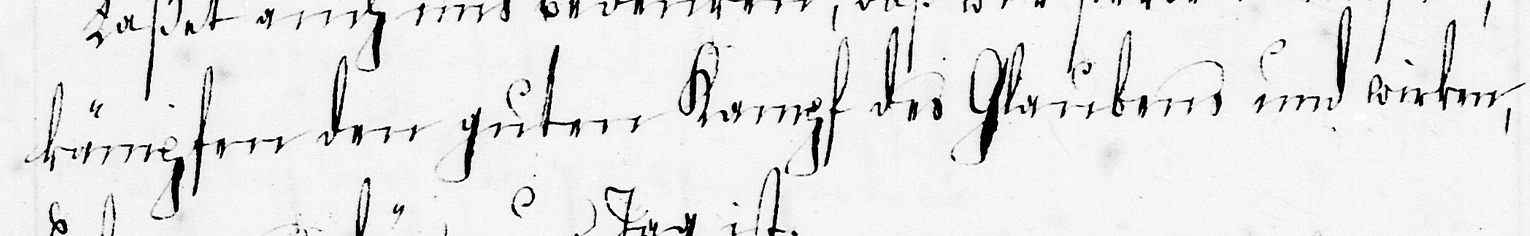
kämpfen den guten Kamp des Glaubens und wirken,
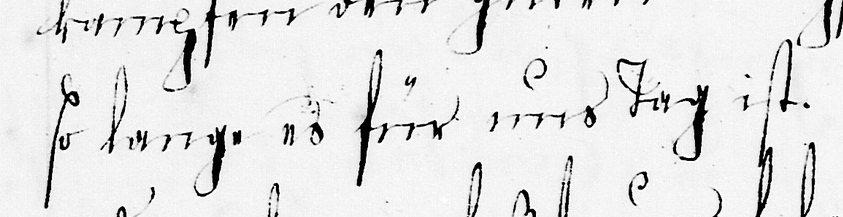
so lange es für uns Tag ist.
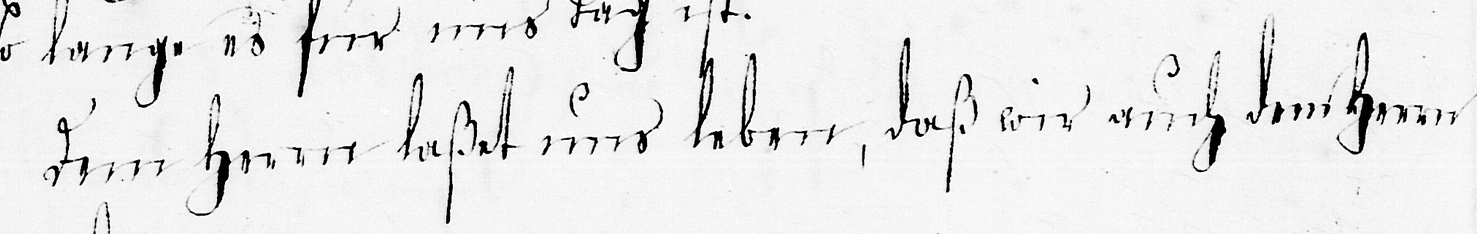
Dem Herrn laßet uns leben, daß wir auch dem Herrn
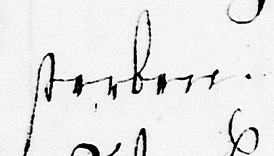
sterben.
